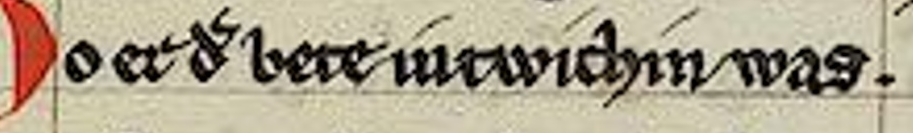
*Do er d(er) bete intwichin was.
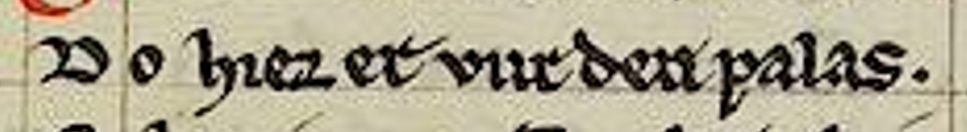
Do hiez er vur den palas.
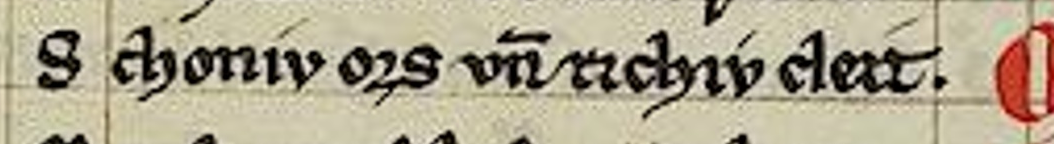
Schoniv ors vn(d) richiv cleit.
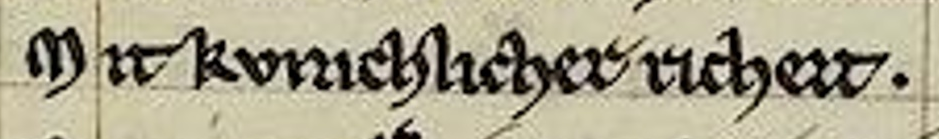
Mit kvnichlicher richeit.
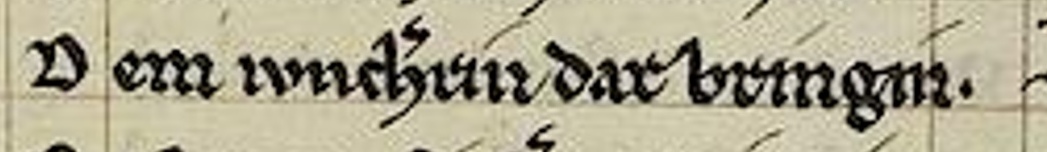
Dem iunch(er)rin dar bringin.
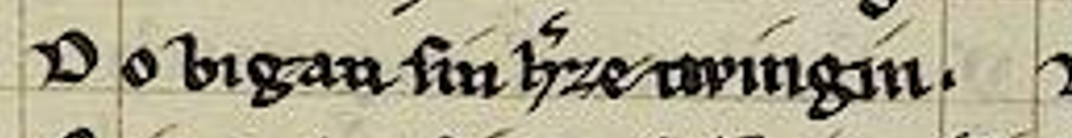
Do bigan ſin h(er)ze twingin.
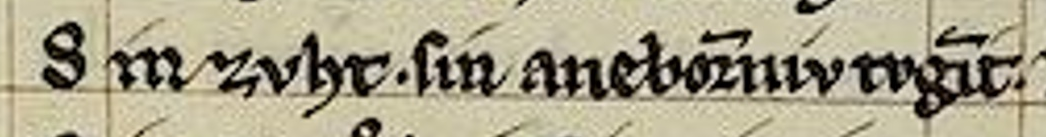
Sin zvht. ſin anebor(n)niv tvgi(n)t.
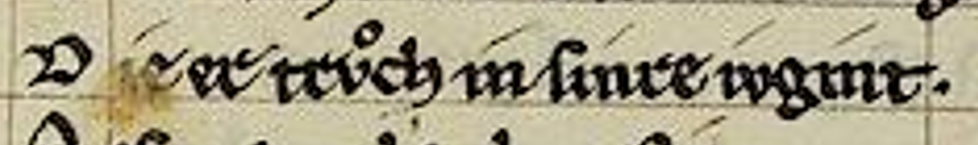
Die er trv°och in ſinre ivgint.
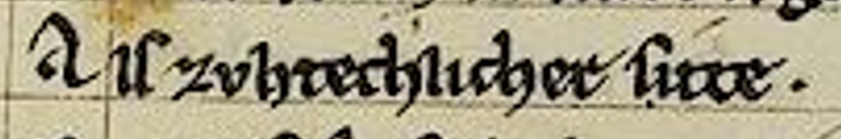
Alſ zvhtechlicher ſitte.
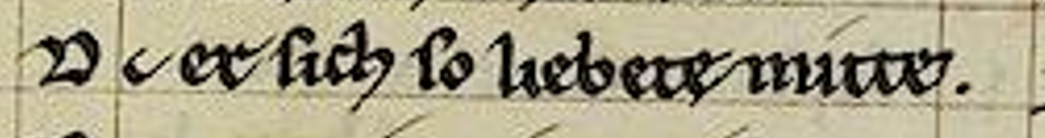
D(az) er ſich ſo liebete mitte.
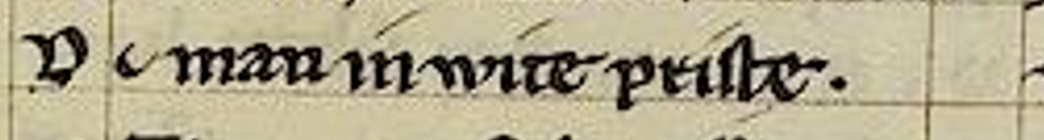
D(az) man in wite priſte.
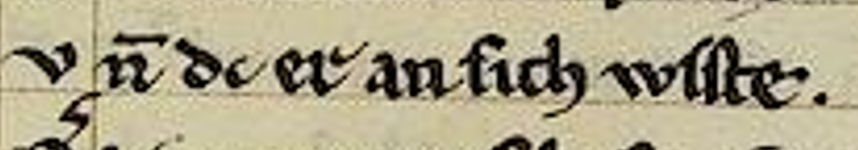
Vn(d) d(az) er an ſich wſſte.
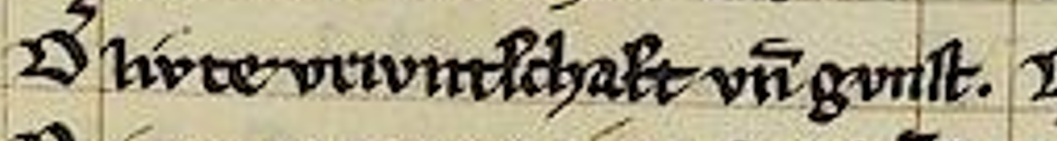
D(er) livte vrivntſchaft vn(d) gvnſt.
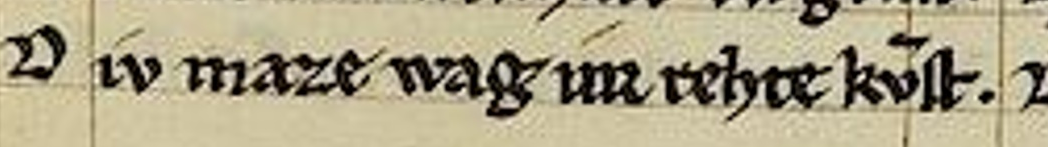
Div maze wag im rehte kv(n)ſt.
